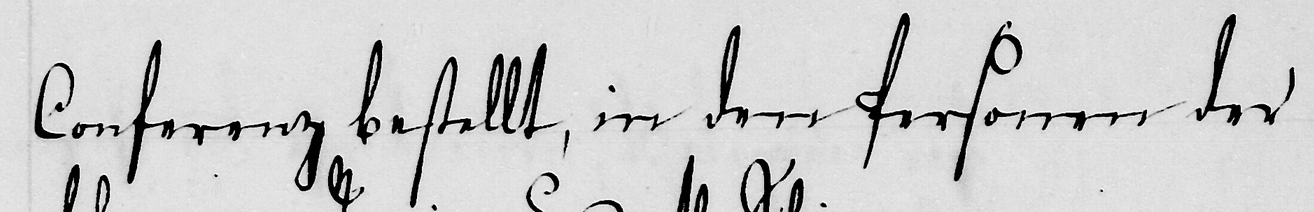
Conferenz bestellt, in den Personen der
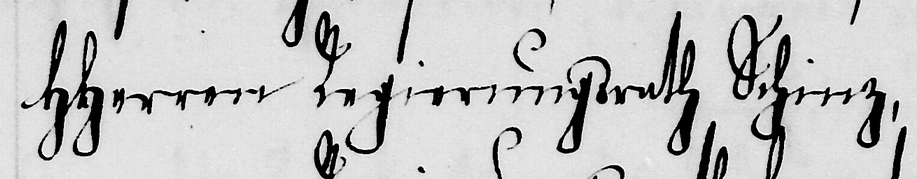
HHerren Regierungsrath Schinz,
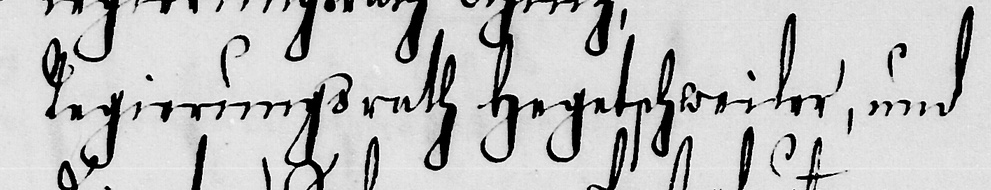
Regierungsrath Hegetschweiler, und
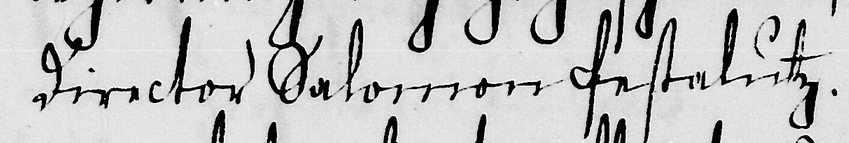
Director Salomon Pestalutz.
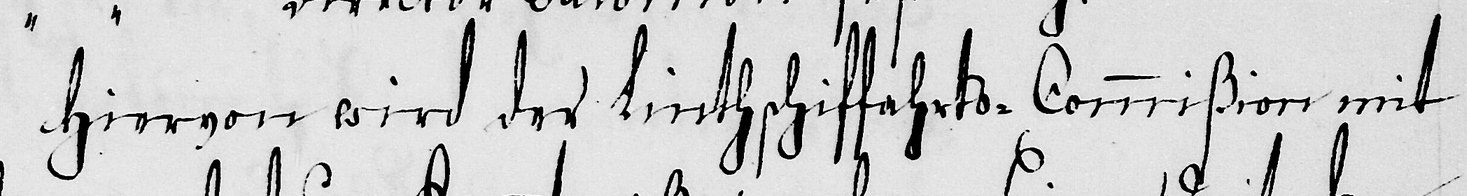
Hiervon wird der Linthschiffahrts-Commißion mit
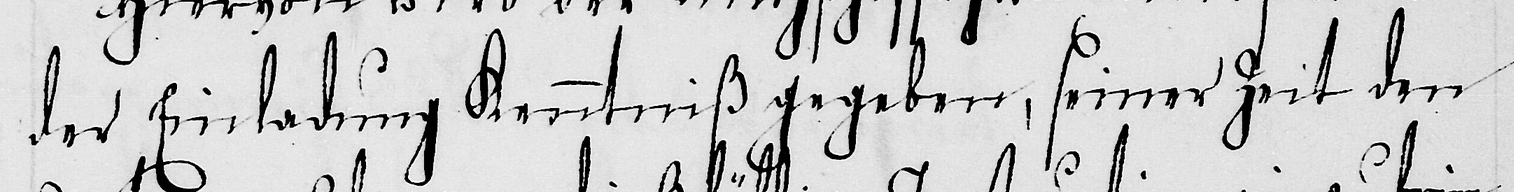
der Einladung Kenntniß gegeben, seiner Zeit den
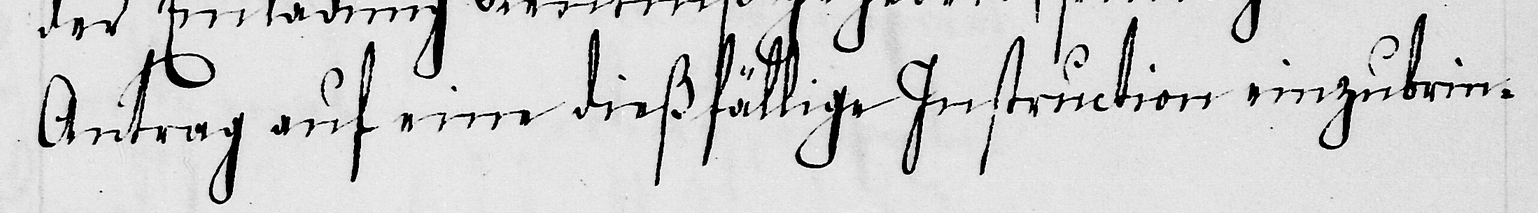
Antrag auf eine dießfällige Instruction einzubrin¬
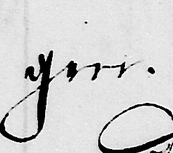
gen.
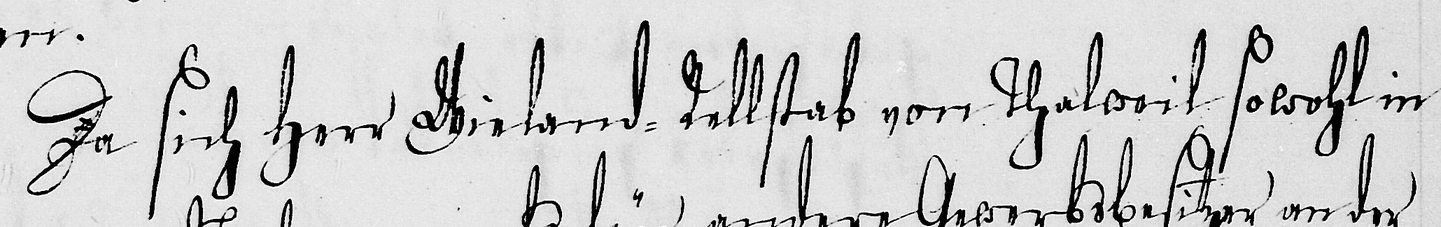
Da sich Herr Wieland-Rellstab von Thalwil sowohl in
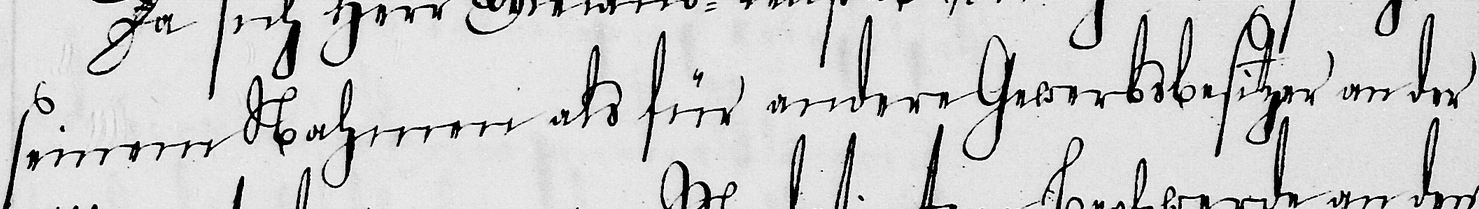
seinem Nahmen als für andere Gewerbsbesitzer an d¬
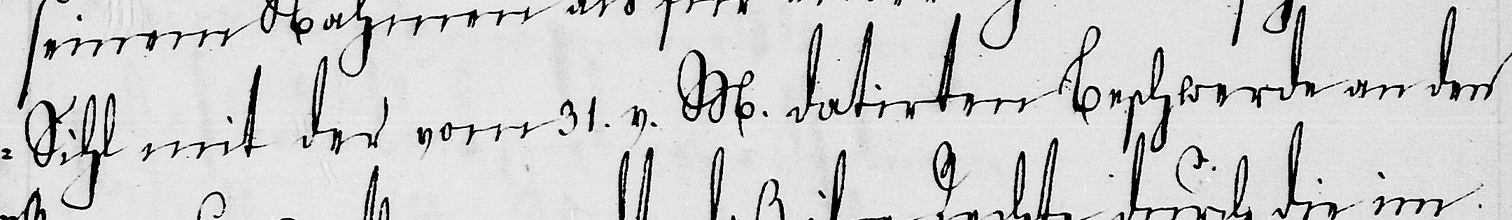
Sihl mit der vom 31. v. M. datirten Beschwerde an den
